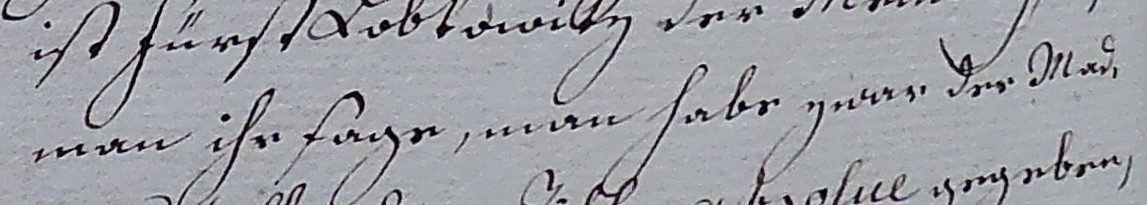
man ihr sage, man habe zwar der Mad.
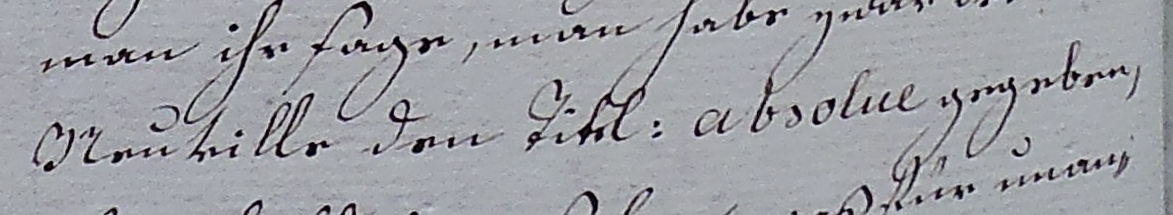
Neuville den Titel: absolue gegeben,
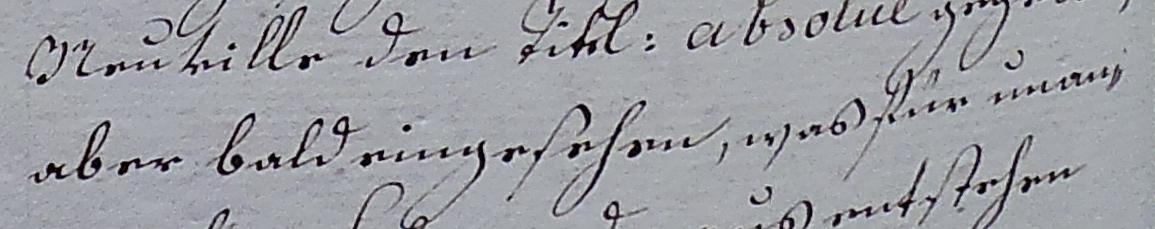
aber bald eingesehen, was für unan¬
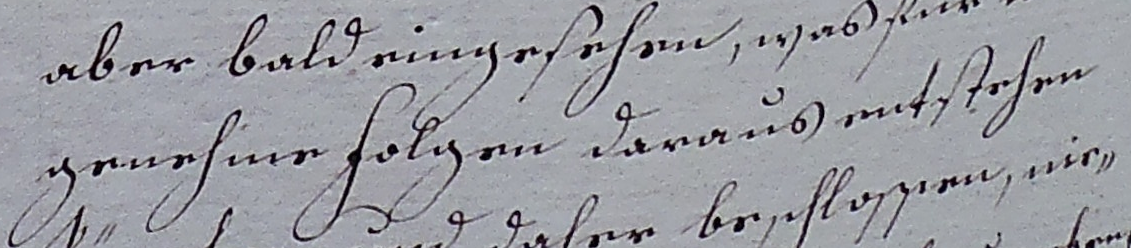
genehme Folgen daraus entstehen
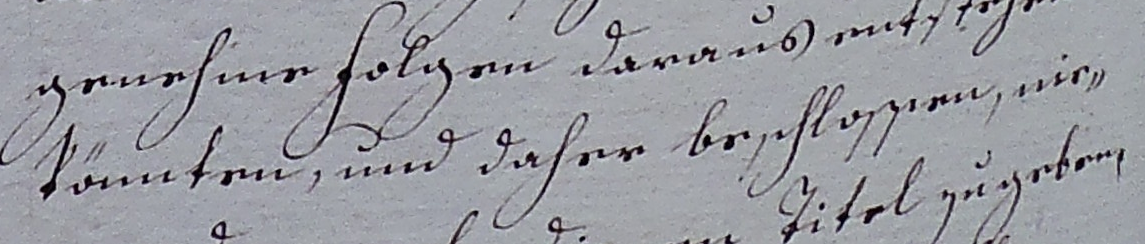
könnten, und daher beschlossen, nie¬
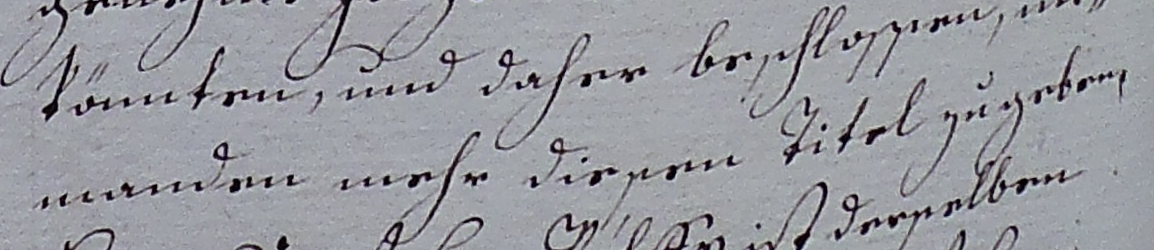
manden mehr diesen Titel zu geben,
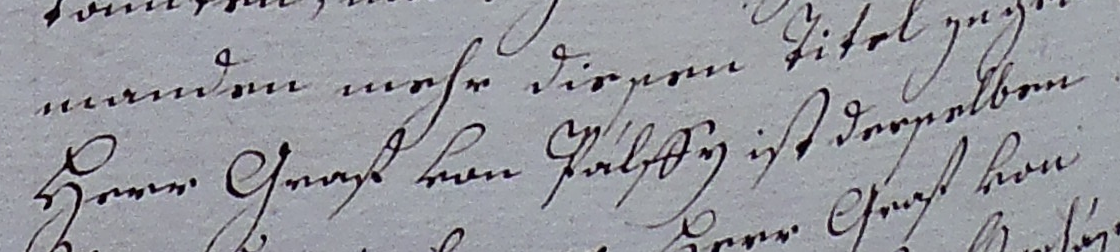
Herr Graf von Pálffy ist derselben
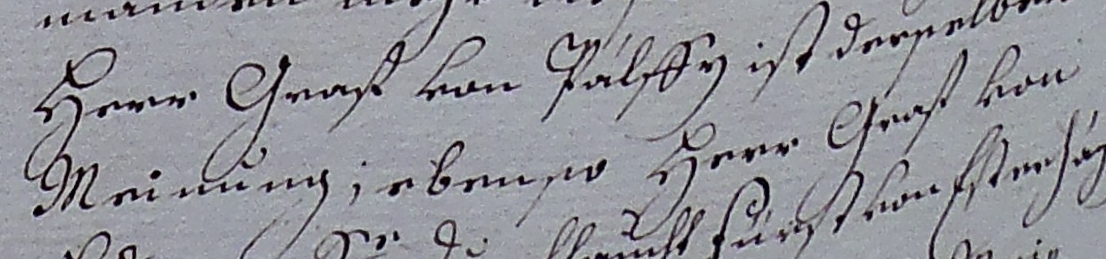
Meinung; ebenso Herr Graf von
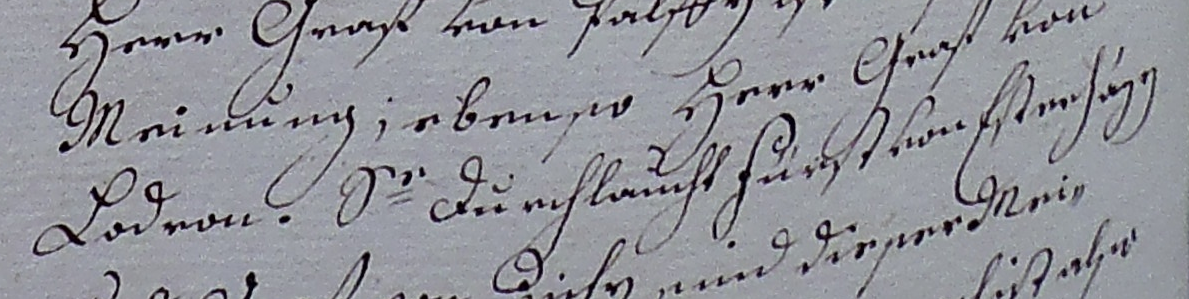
Lodron. Se͇ Durchlauht Fürst von Esterházy
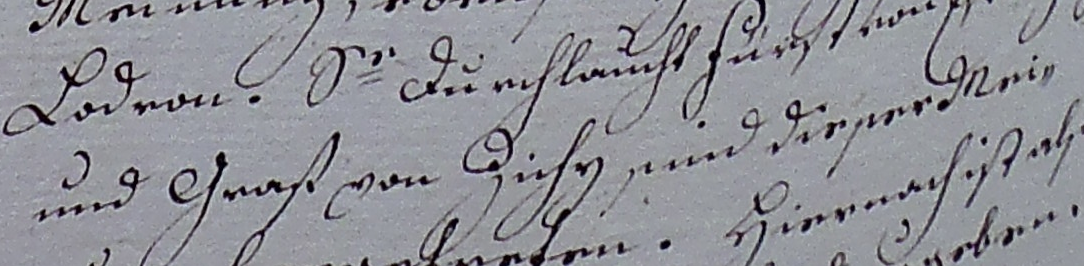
und Graf von Zichy sind dieser Mei¬
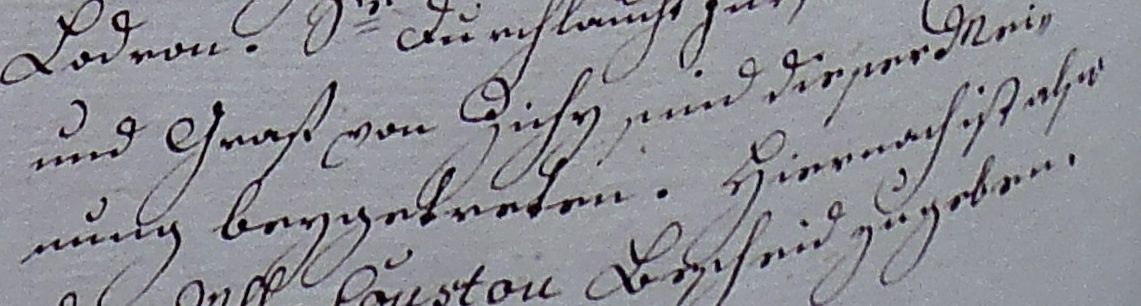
nung beygetreten. Hiernach ist also
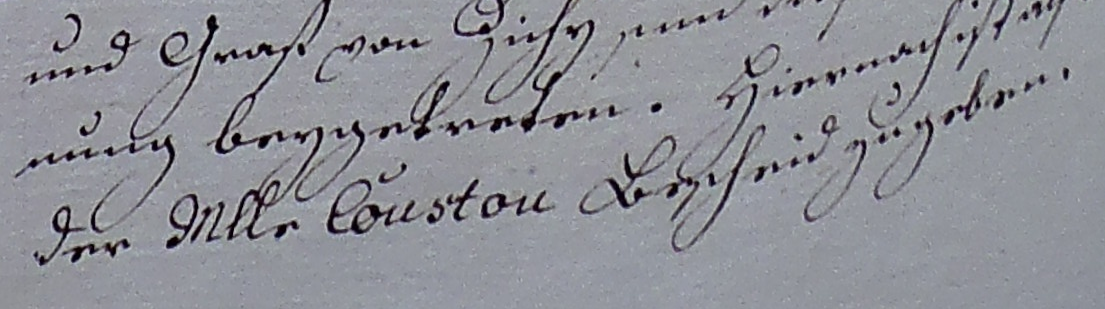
der Mlle Coustou Bescheid gegeben.
